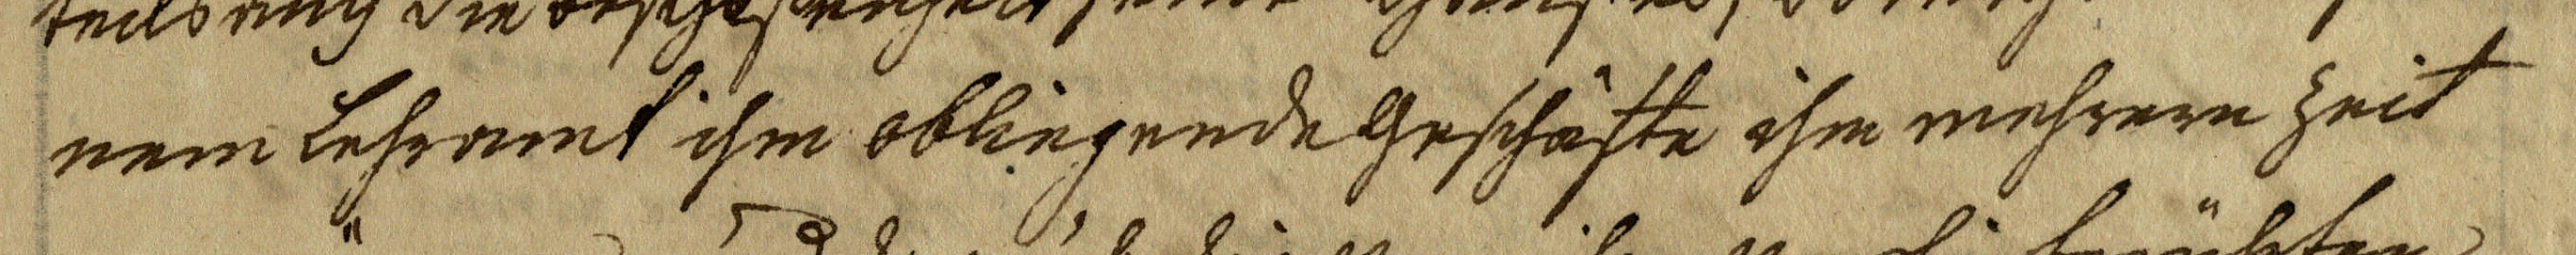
nem Lehramt ihm obliegende Geschäfte ihm mehrere Zeit
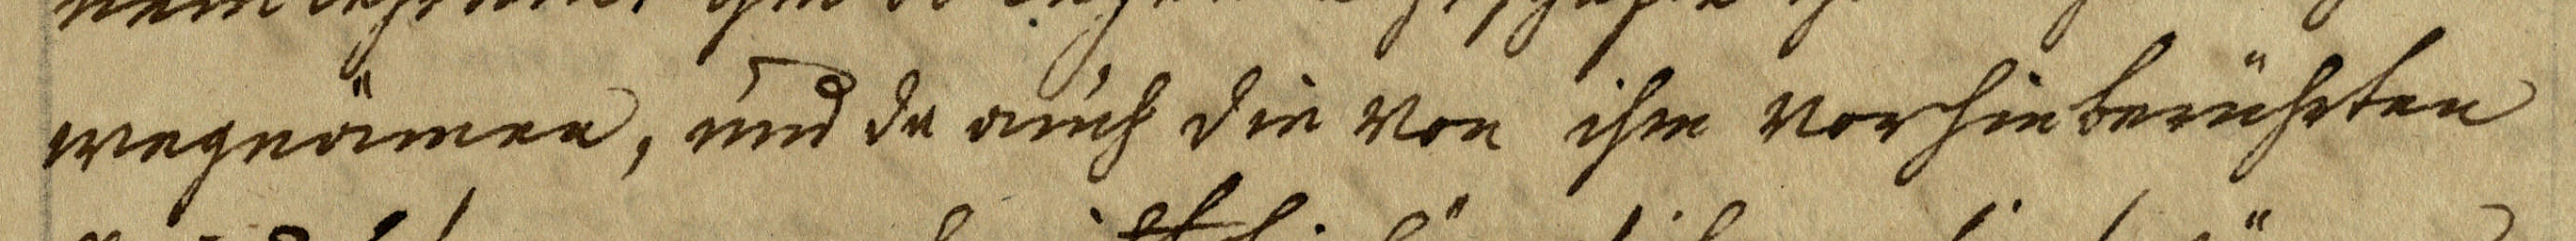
wegnämen, und da auch die von ihm vorhin berührten
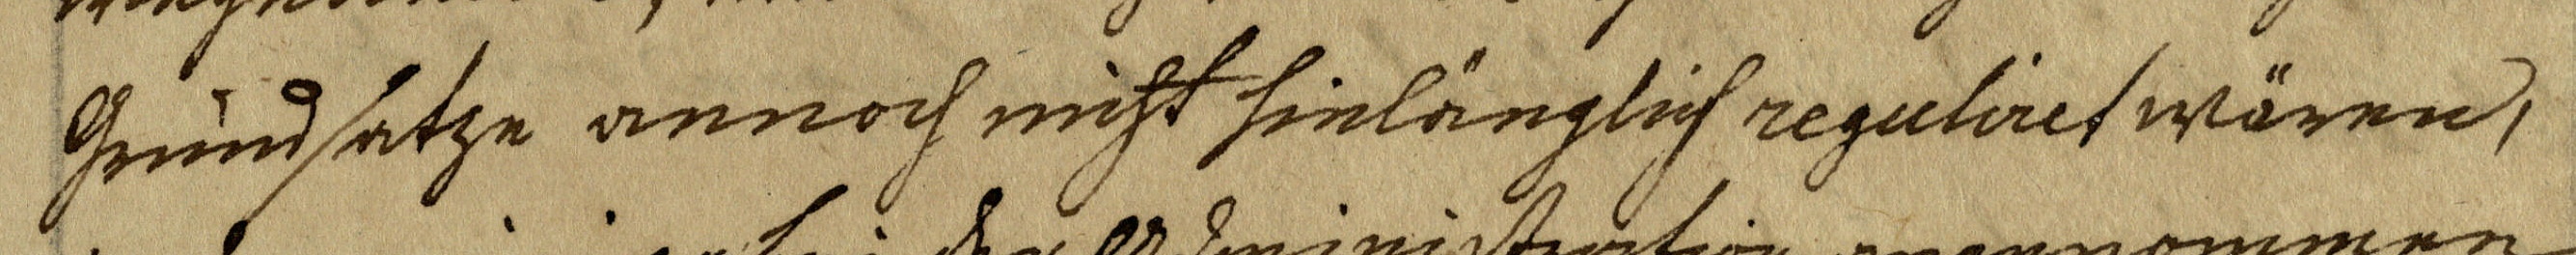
Grundsatze annoch nicht hinlänglich reguliret wären,
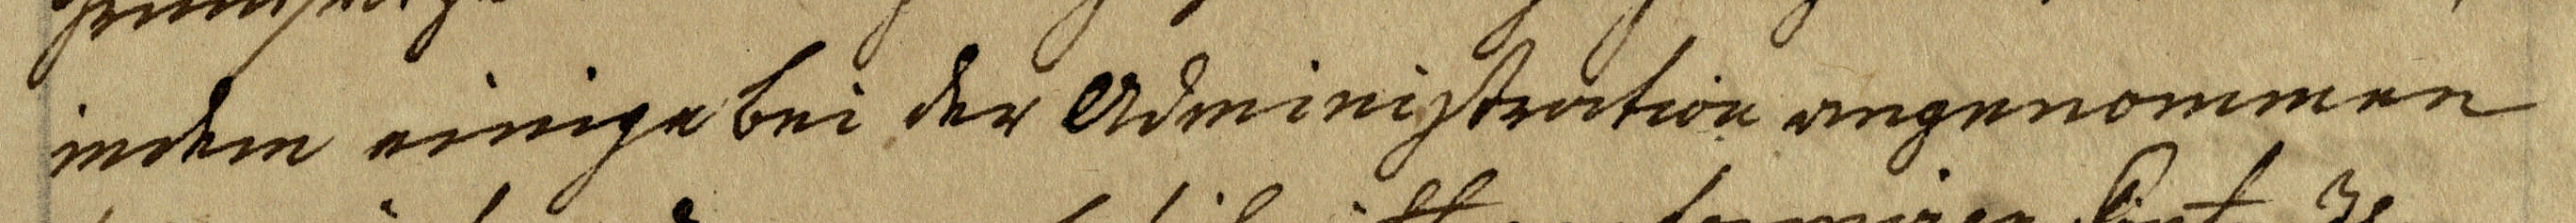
indem einige bei der Administration angenommen
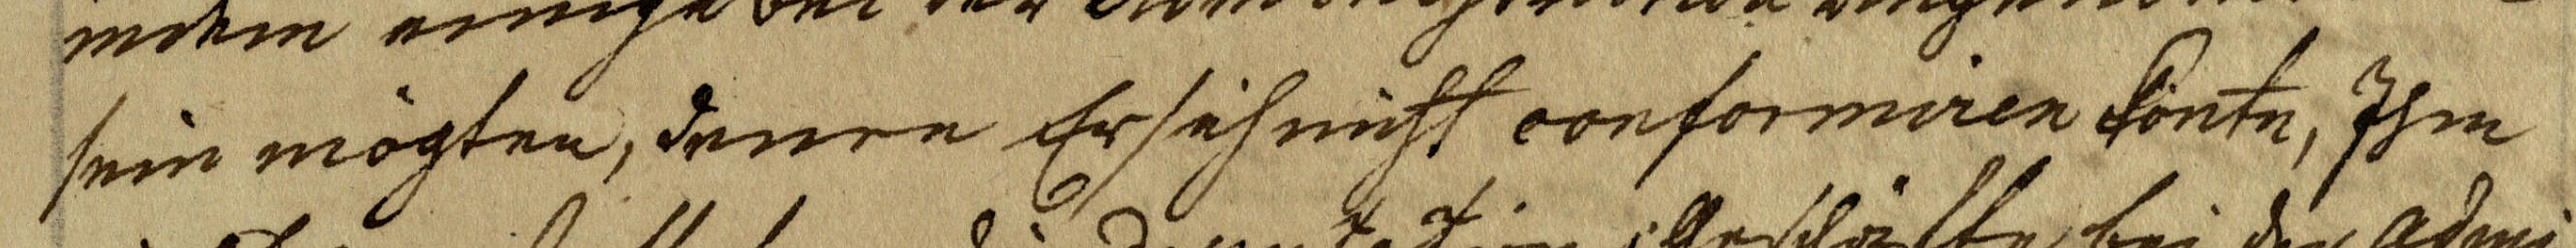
sein mögten, denen Er sich nicht conformiren könte, Ihm
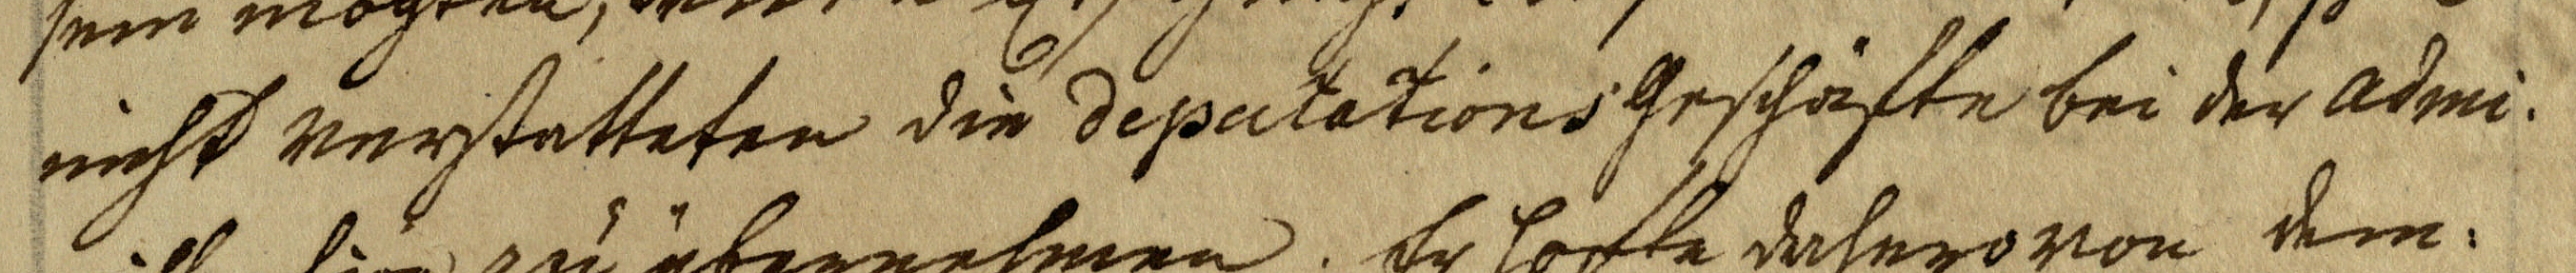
nicht verstatteten die deputations Geschäfte bei der Admi¬
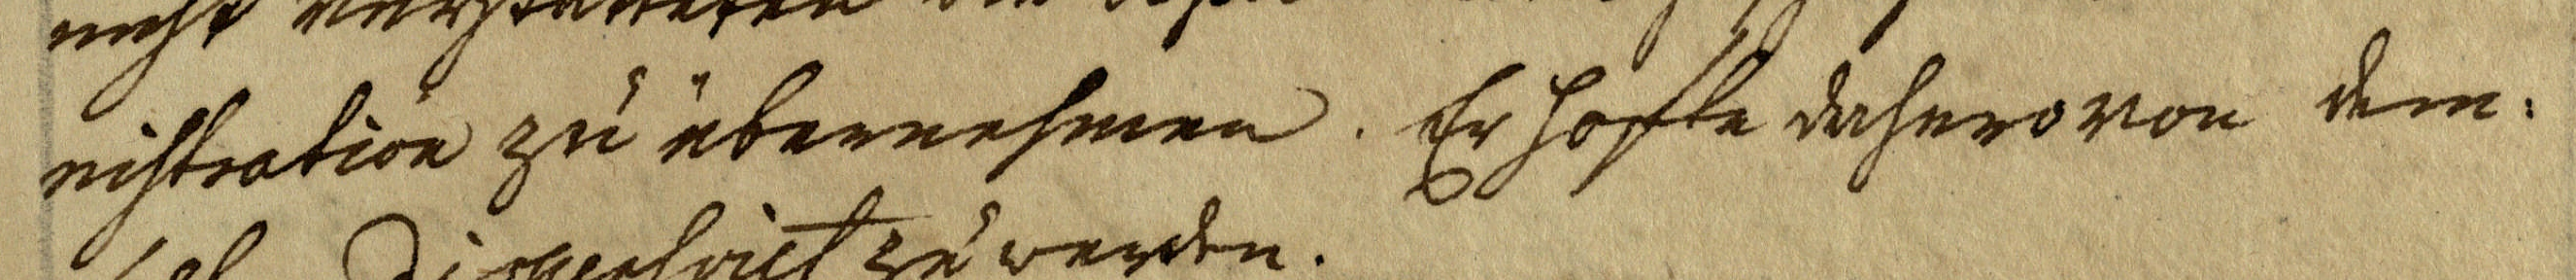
nistration zu übernehmen. Er hofte dahero von dem¬
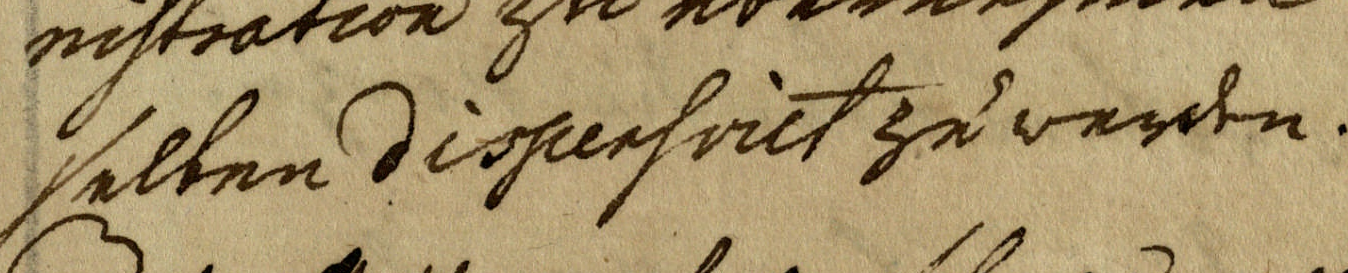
selben dispensiret zu .
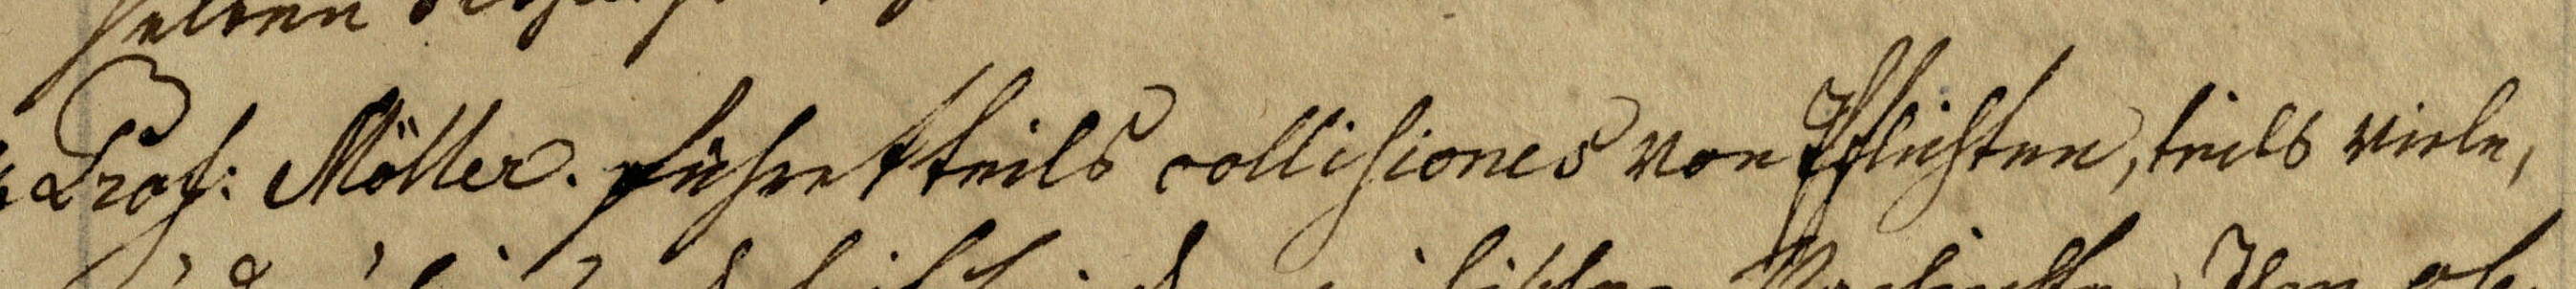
dh Prof. Möller. führet teils collisiones von Pflichten, teils viele,
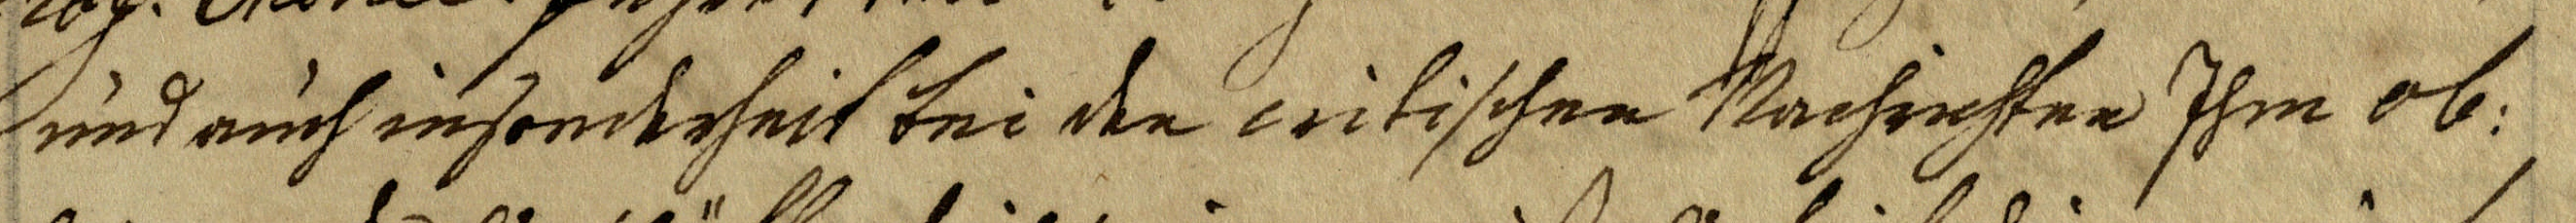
und auch insonderheit bei den Critischen Nachrichten Ihm ob¬
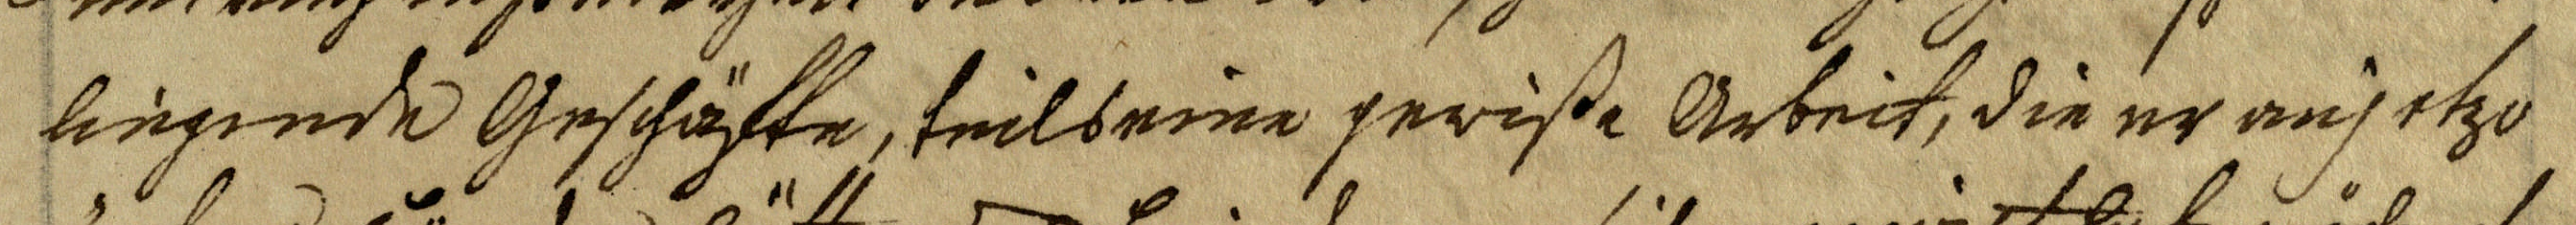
liegende Geschäfte, teils eine e Arbeit, die er anjetzo
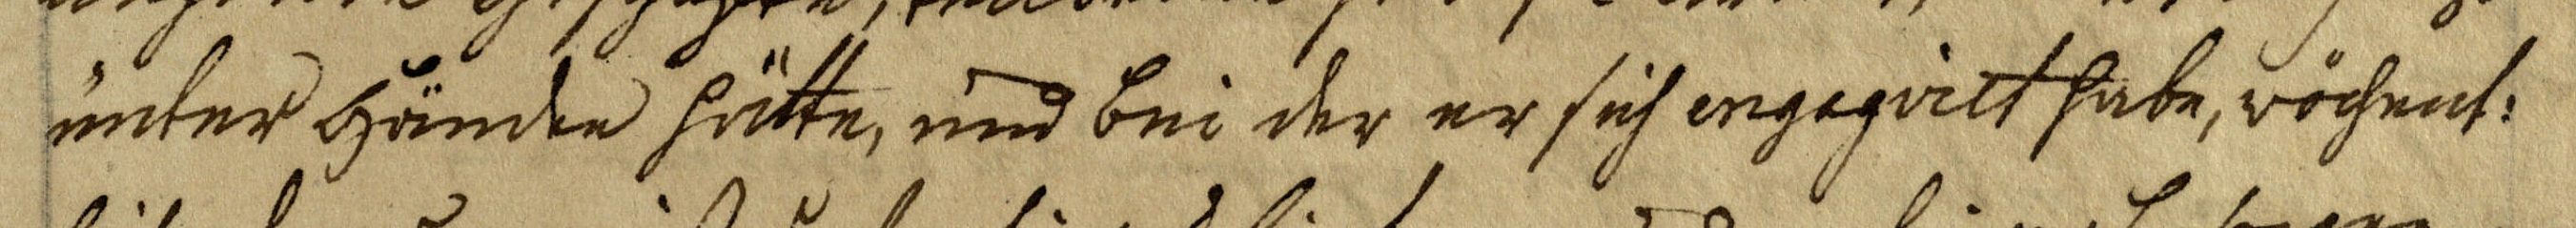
unter Händen hätte, und bei der er sich engagiret habe, wöchent¬
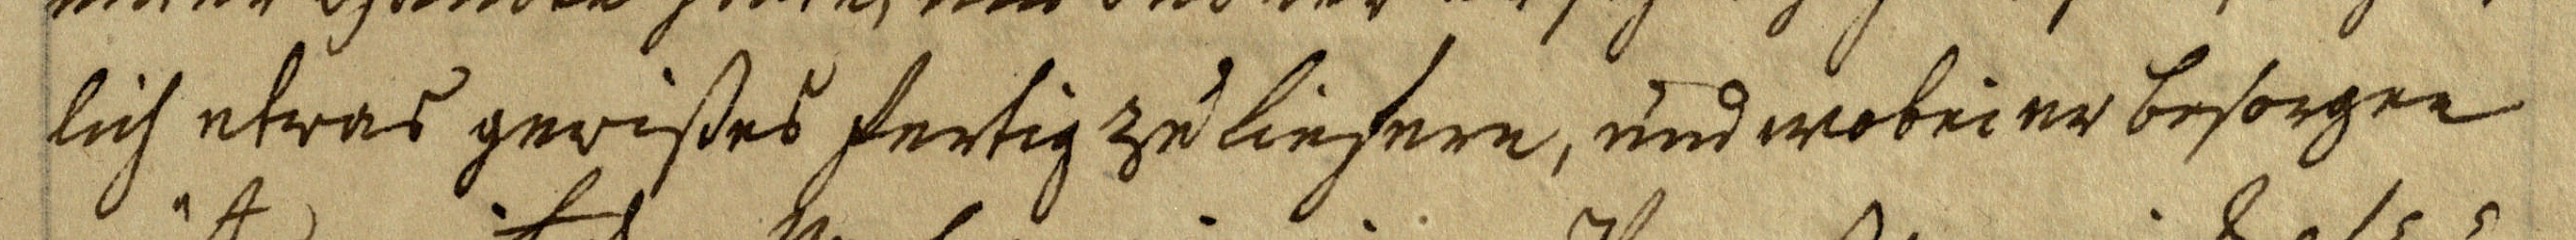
lich etwas gewißes fertig zu liefern, und wobei er besorgen
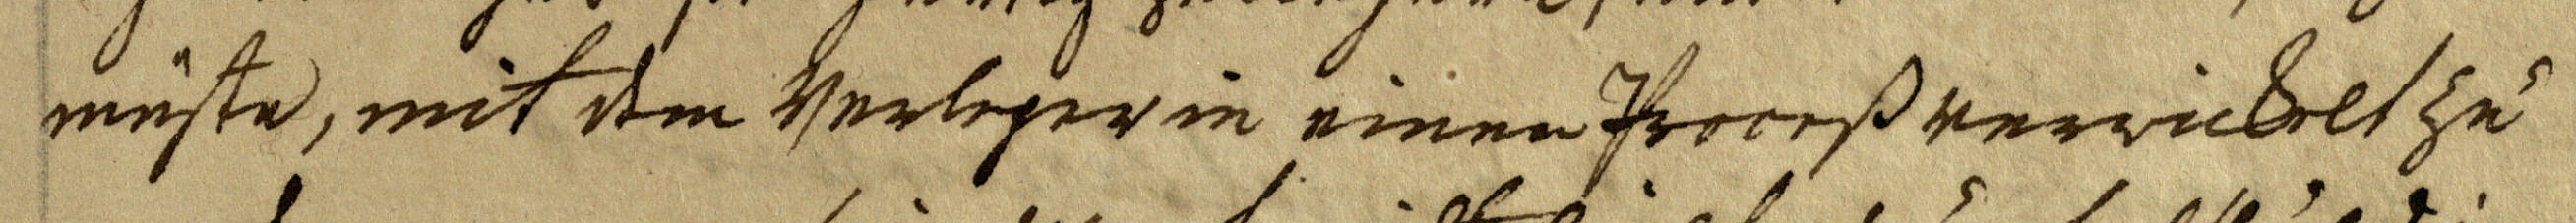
müßte, mit dem Verleger in einen Proceß verwickelt zu
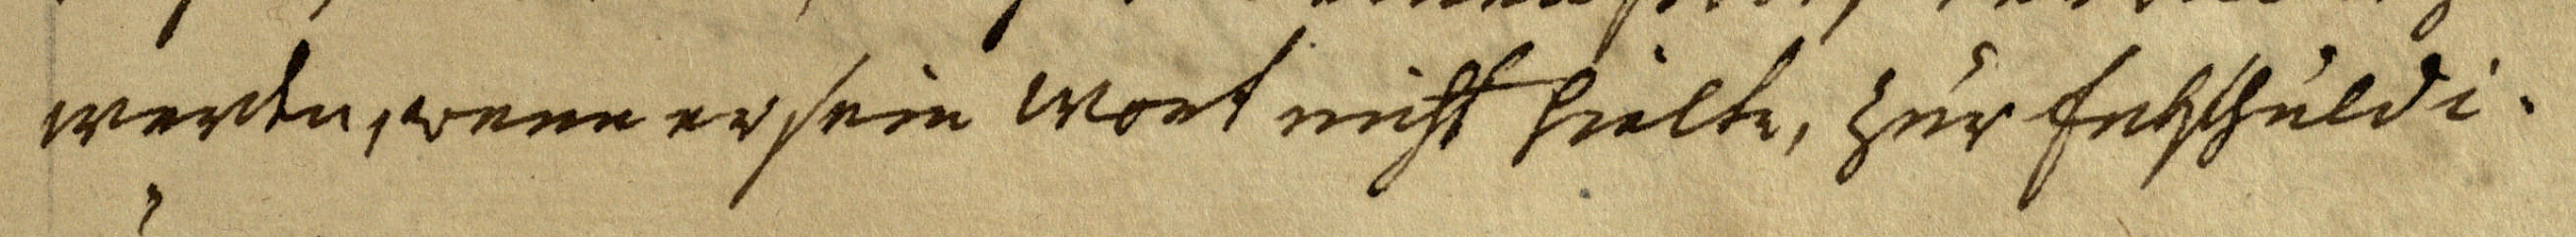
werden, wenn er sein Wort nicht hielte, zur Entschuldi¬
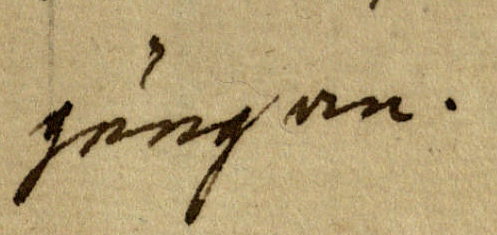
gung an.
